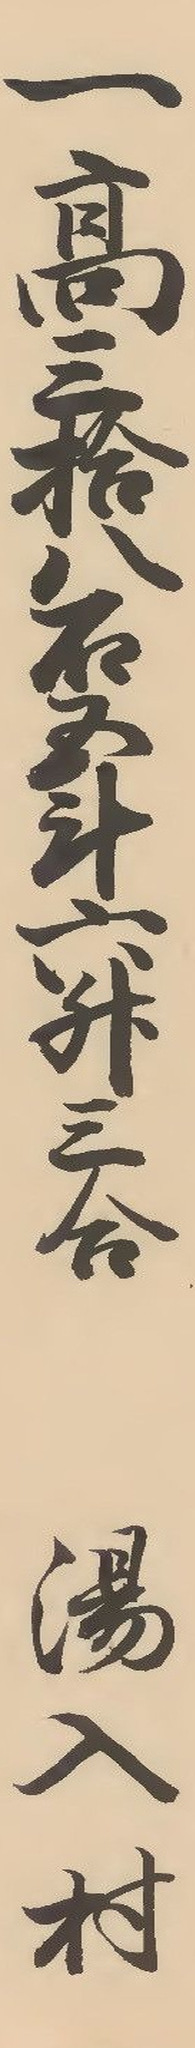一高三拾八石五斗六升三合湯入村

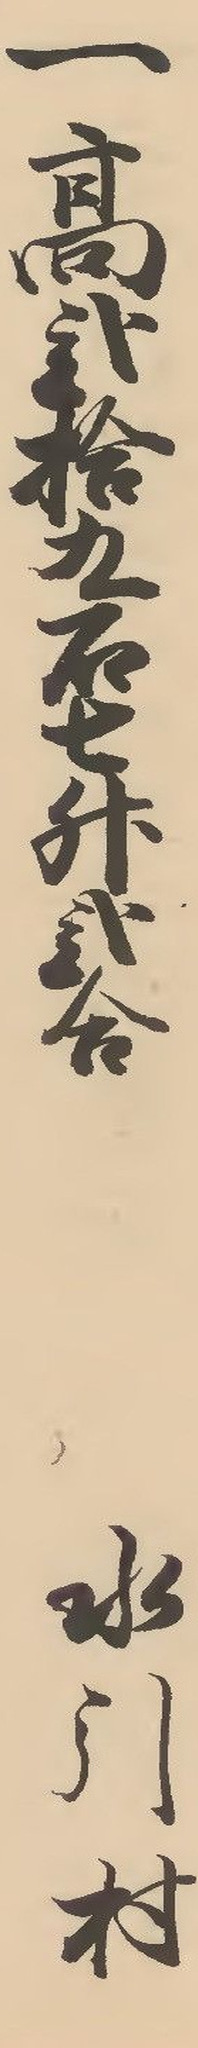一高弐拾九石七升弐合水引村
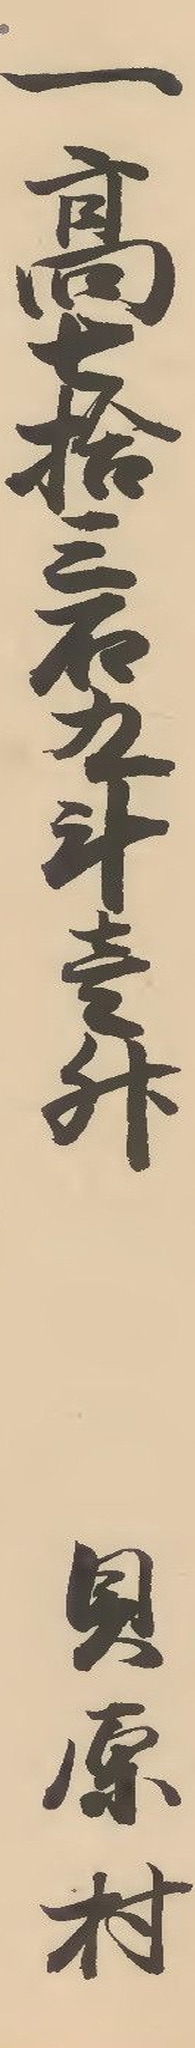一高七拾三石九斗壱升貝原村
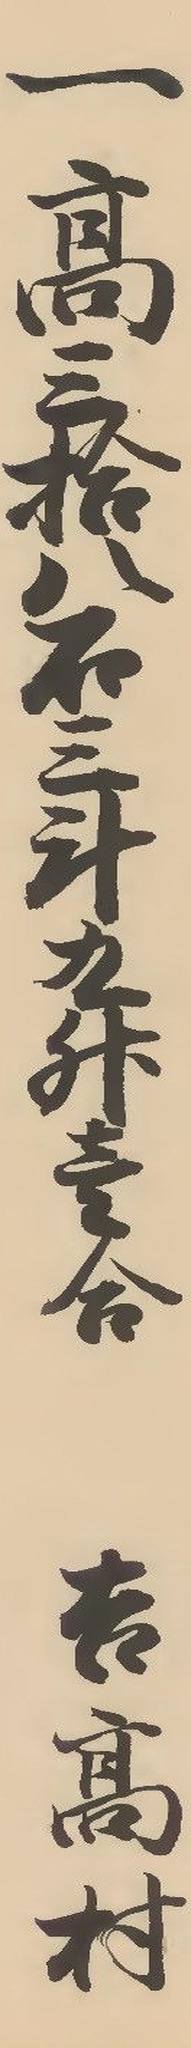一高三拾八石三斗九升壱合吉高村
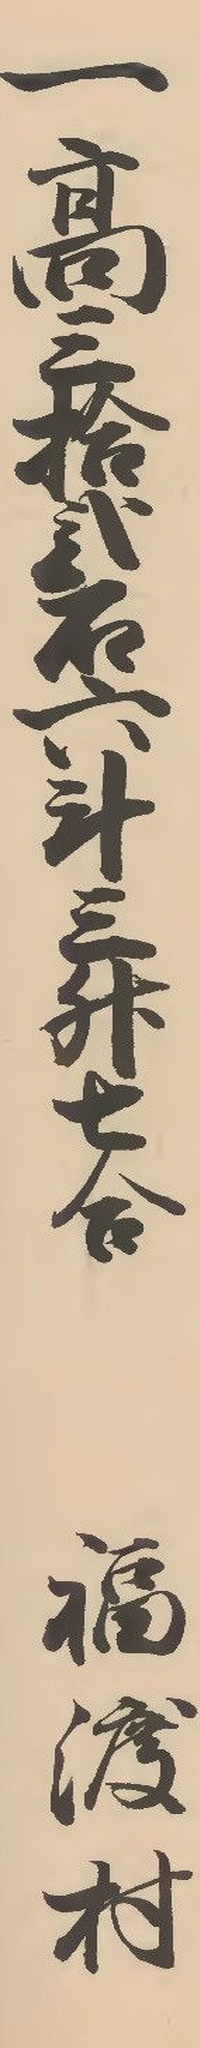一高三拾弐石六斗三升七合福渡村
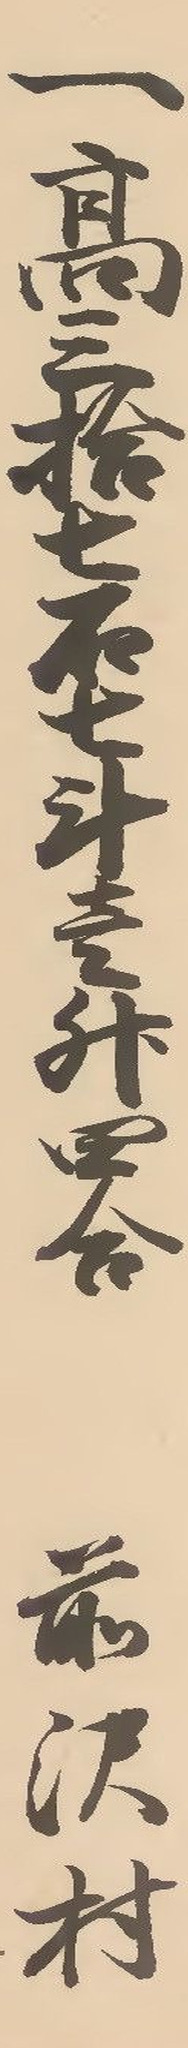一高三拾七石七斗壱升四合前沢村
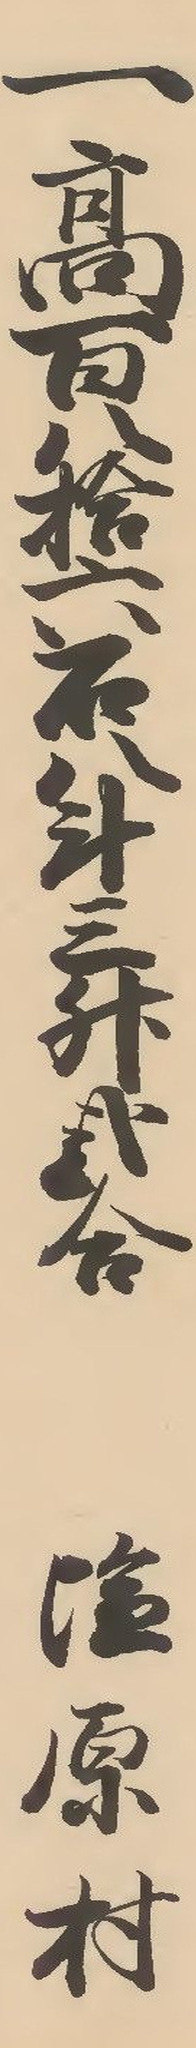一高百八拾六石八斗三升弐合塩原村
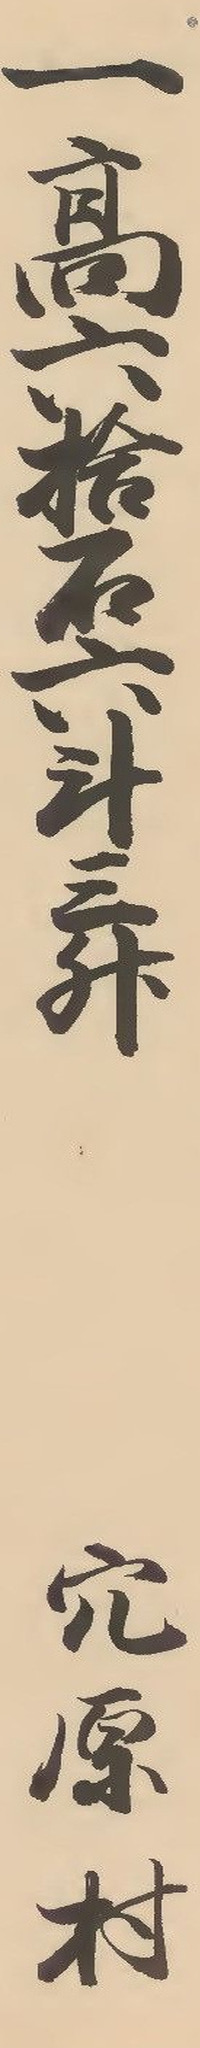一高六拾石六斗三升穴原村
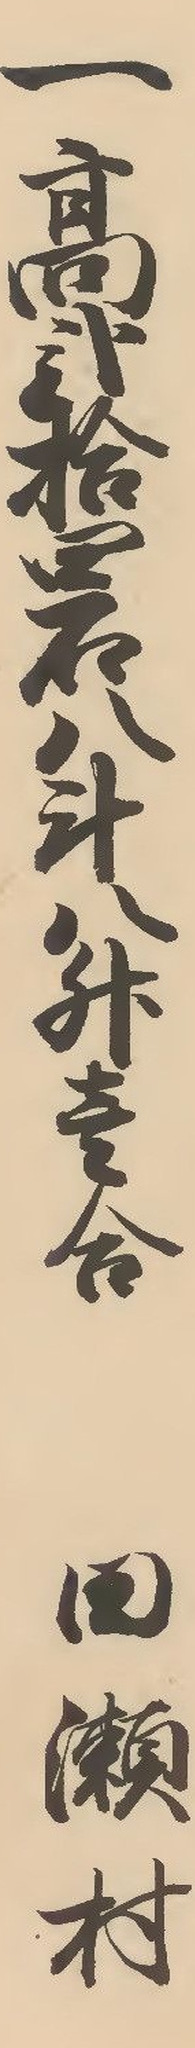一高弐拾四石八斗八升壱合田瀬村

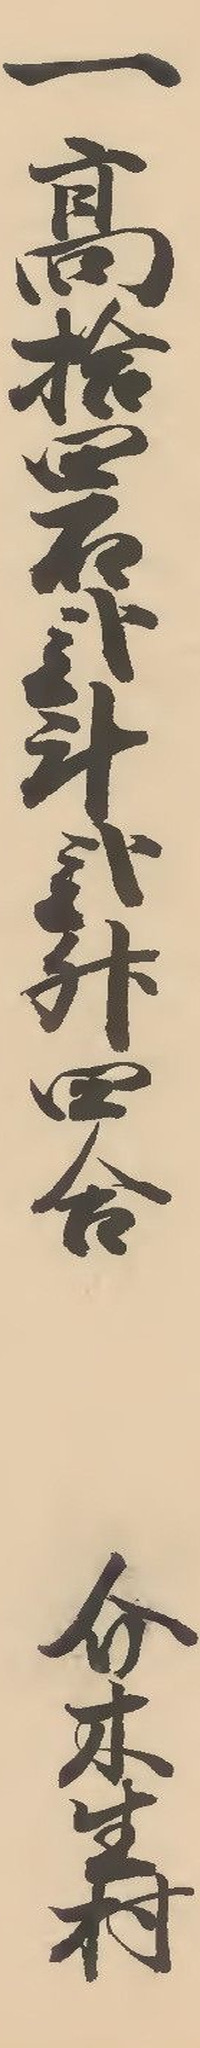一高拾四石弐斗弐升四合介木生村
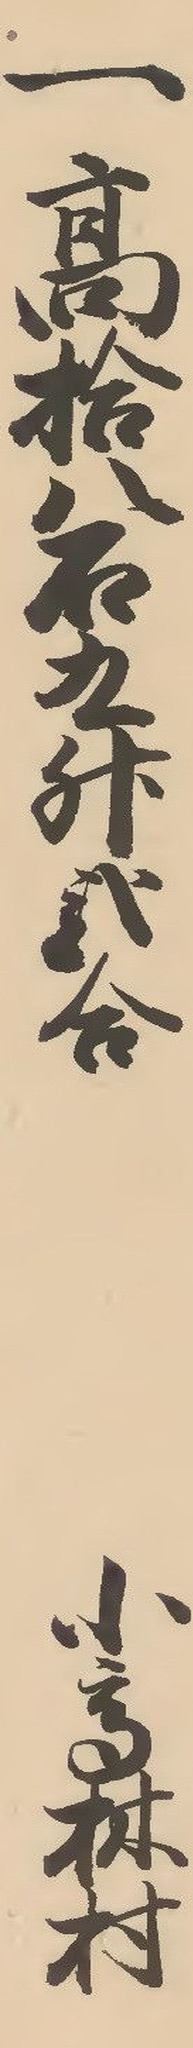一高拾八石九升弐合小高林村
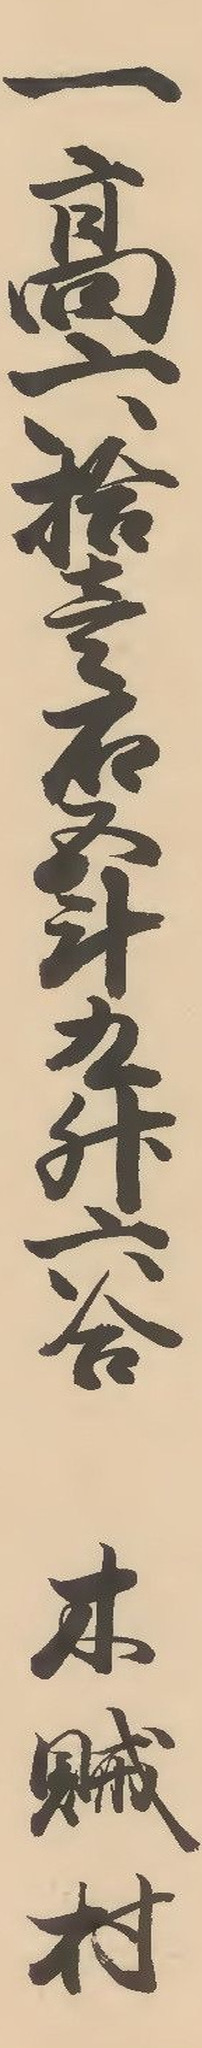一高六拾壱石五斗九升六合木賊村
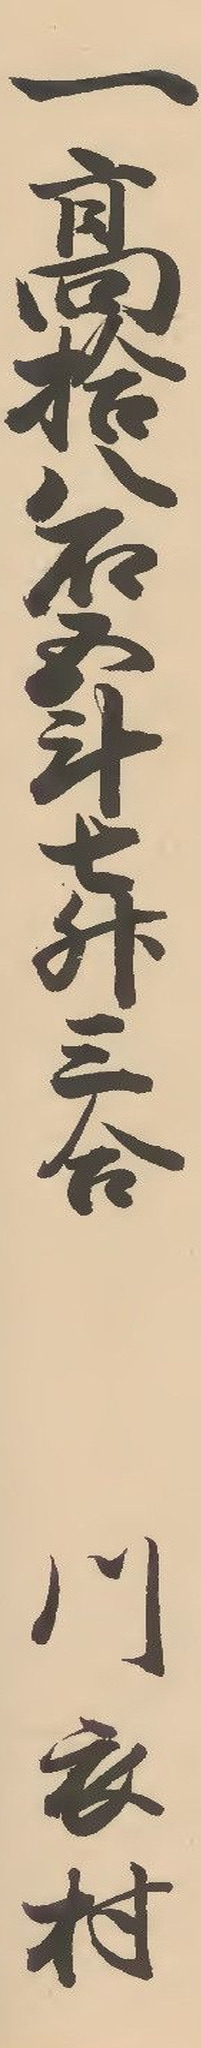一高拾八石五斗七升三合川衣村
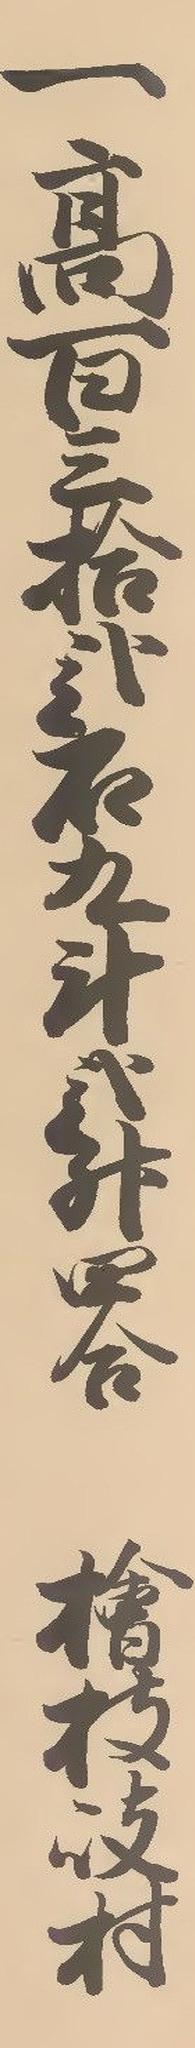一高百三拾弐石九斗弐升四合桧枝岐村
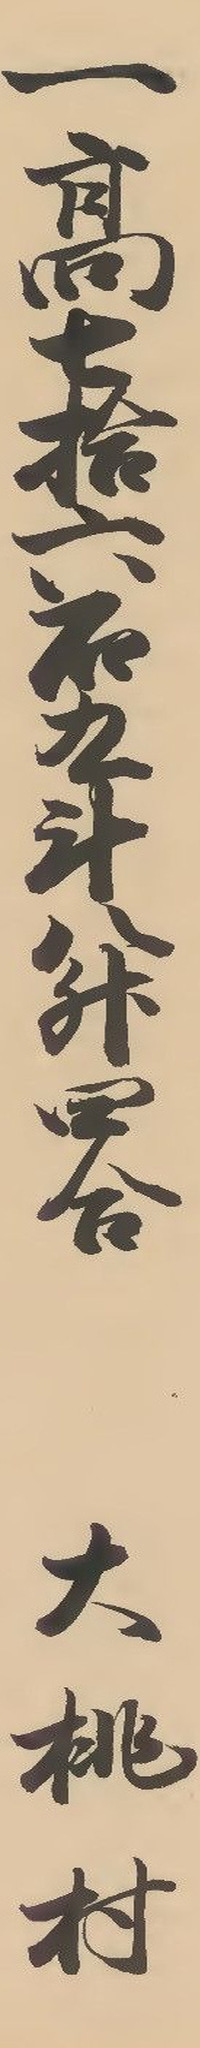一高七拾六石九斗八升四合大桃村
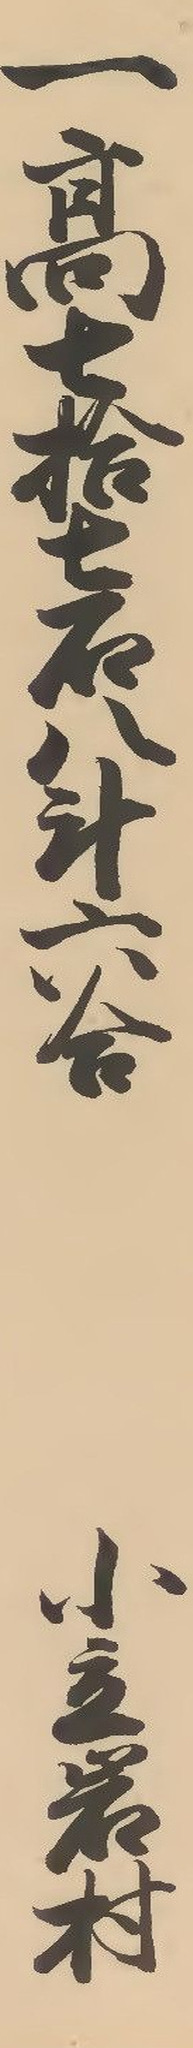一高七拾七石八斗六合小立岩村
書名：陸奥国郷帳　１
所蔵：国立公文書館 National Archives of Japan
